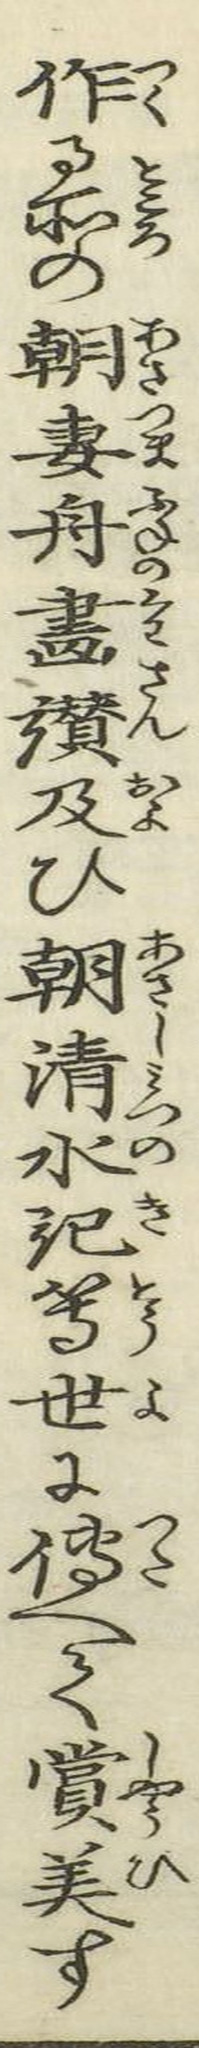作る所の朝妻舟畵讃及ひ朝清水記等世に傳へて賞美す
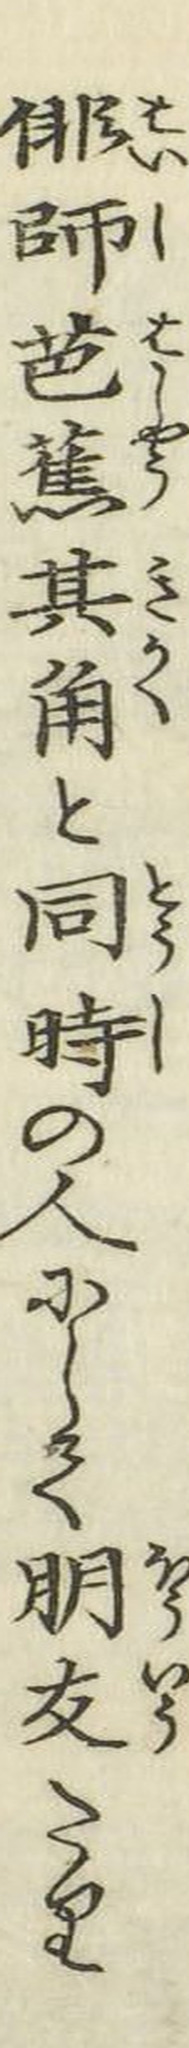俳師芭蕉其角と同時の人にして朋友たり
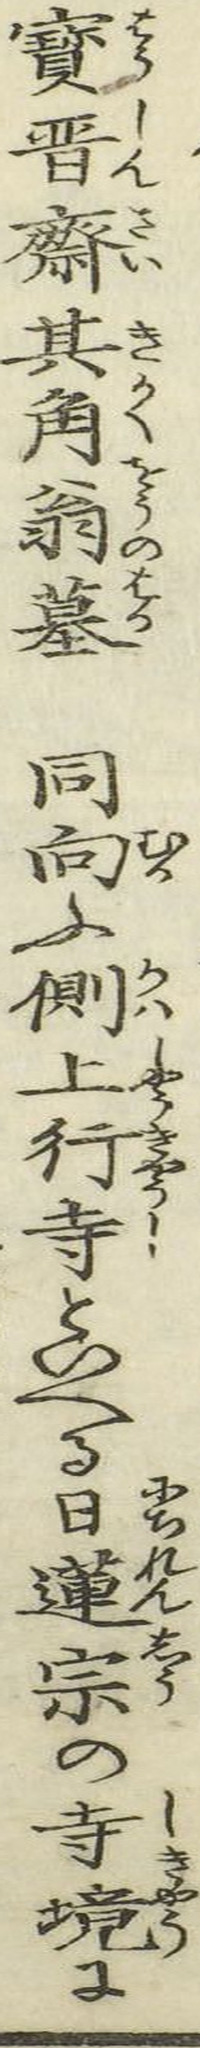寳晋齋其角翁墓同向ふ側上行寺といへる日蓮宗の寺境に
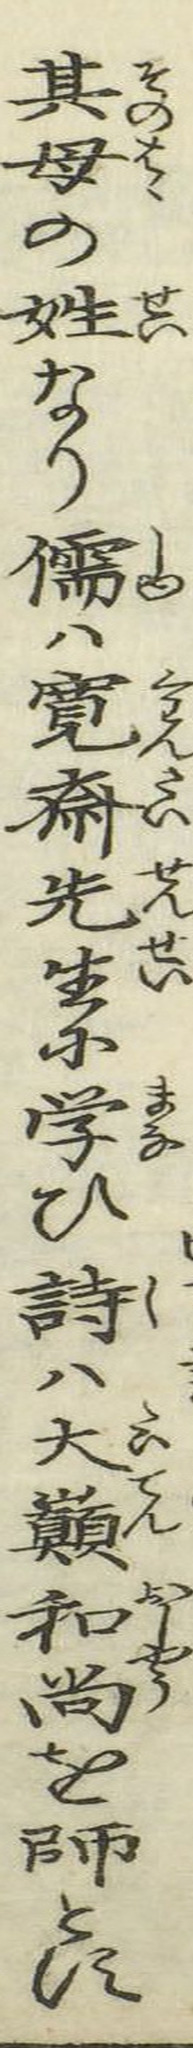其母の姓なり儒は寛斎先生に学ひ詩は大巓和尚を師とす
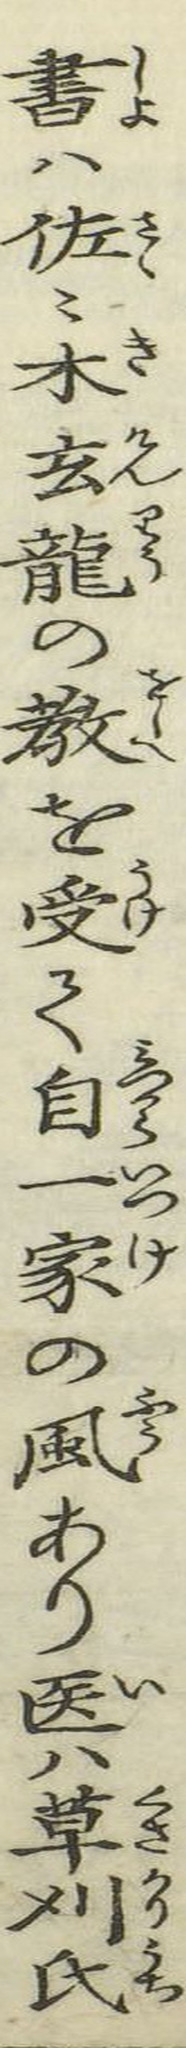書は佐々木玄龍の教を受て自一家の風あり医は草刈氏
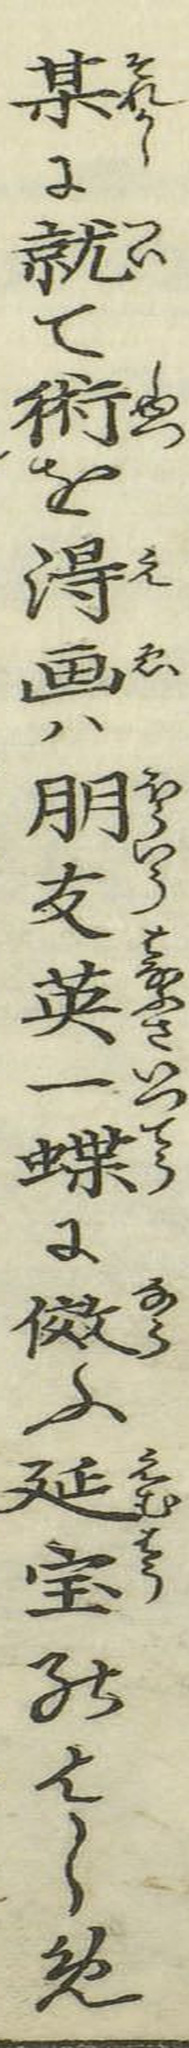某に就て術を得画は朋友英一蝶に倣ふ延宝のはしめ
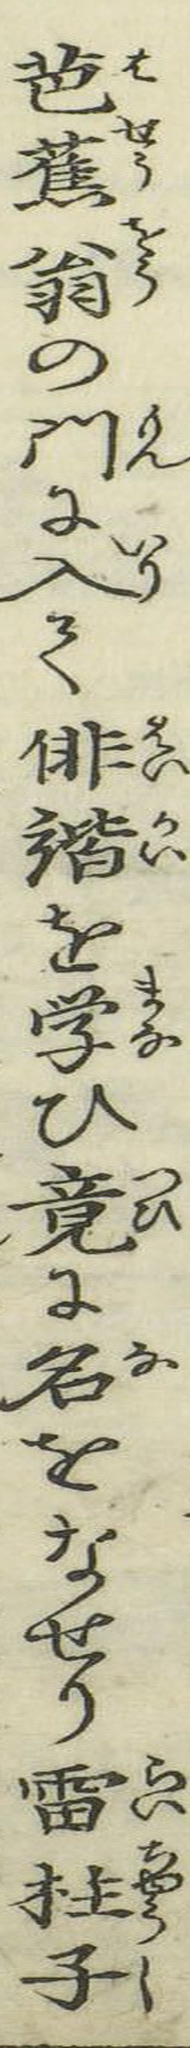芭蕉翁の門に入て俳諧を学ひ竟に名をなせり雷柱子
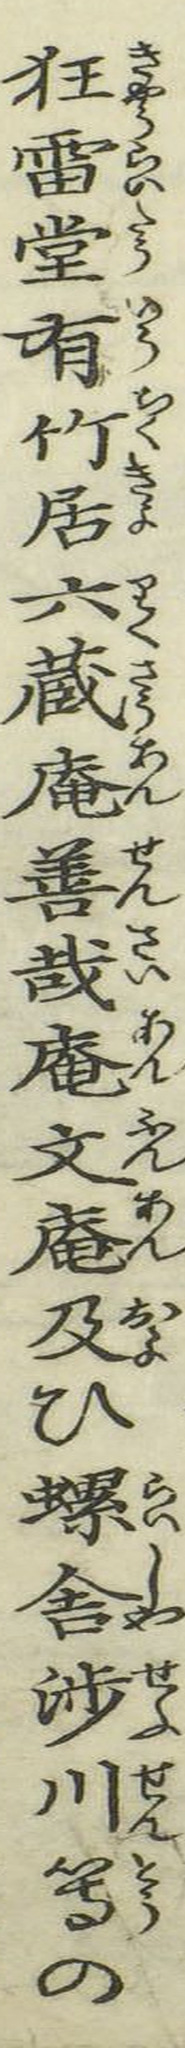狂雷堂有竹居六蔵庵善哉庵文庵及ひ螺舎渉川等の

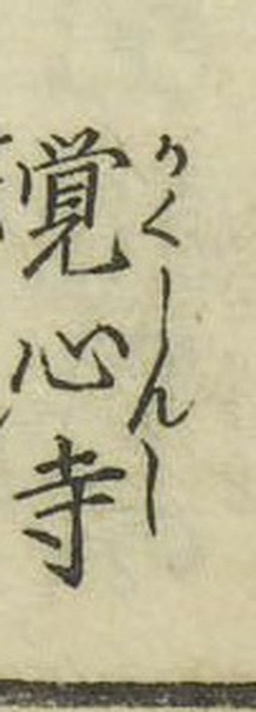覚心寺
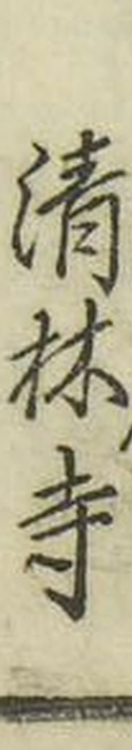清林寺
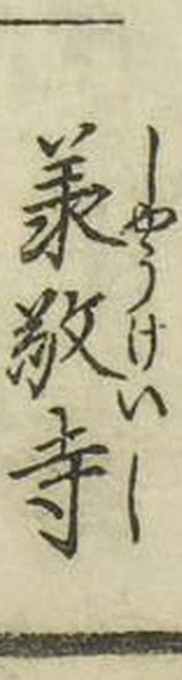承敬寺
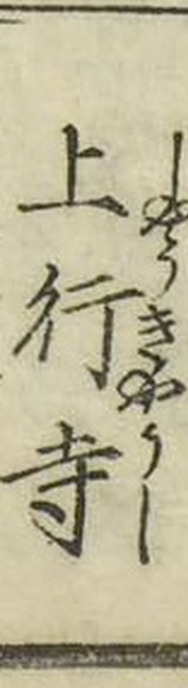上行寺
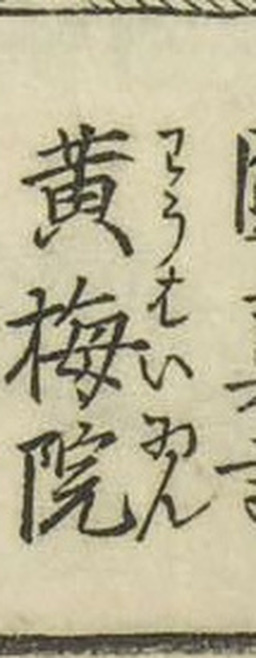黄梅院
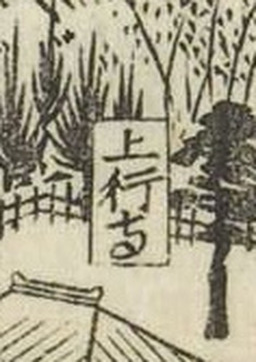上行寺

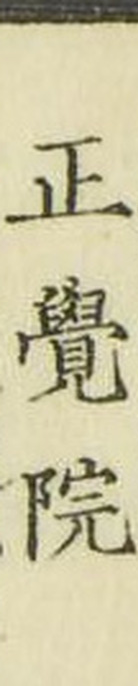正覺院

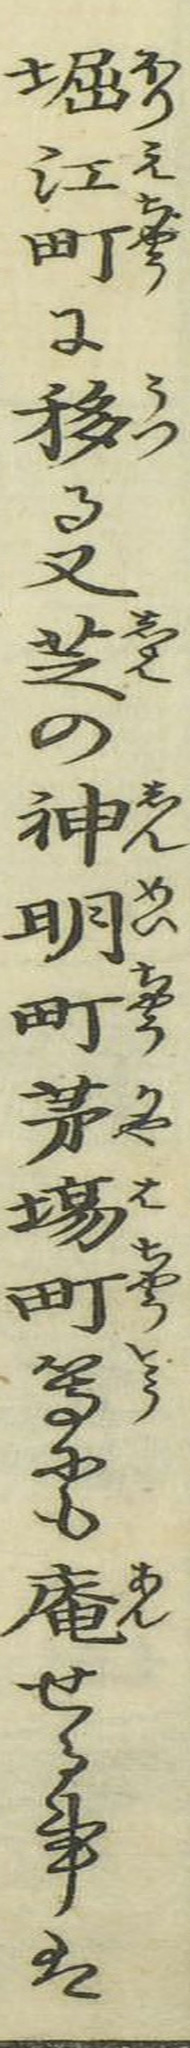堀江町に移る又芝の神明町茅塲町等にも庵せる事は
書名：江戸名所図会 20巻 巻之7
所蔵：東京学芸大学教育コンテンツアーカイブ
